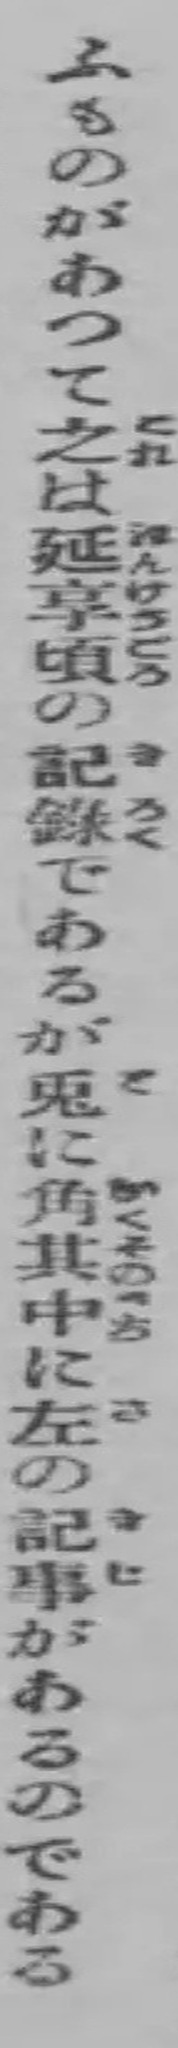ふものがあつて之は延享頃の記録であるが兎に角其中に左の記事があるのである
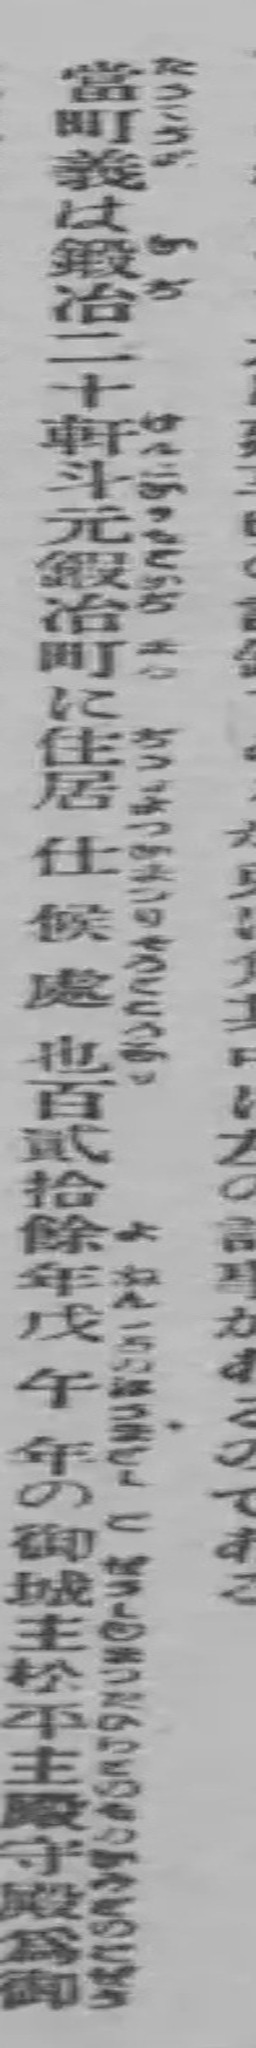当町義は鍛冶二十軒斗元鍛冶町に住居仕候処也百弐拾余年戊午年の御城主松平主殿守殿為御
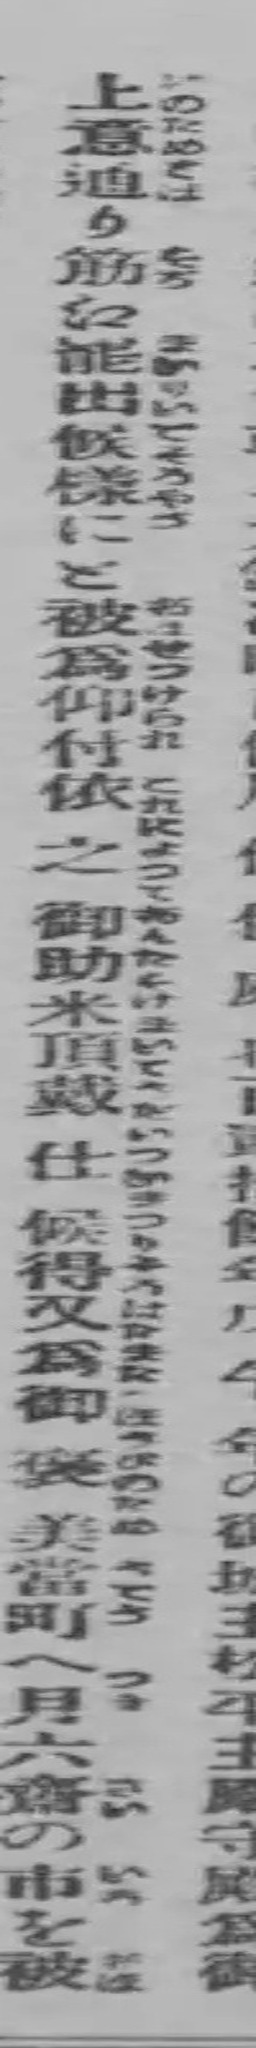上意通り筋え罷出候様にと被為仰付依之御助米頂戴仕候又為御褒美当町へ月六斉の市を被
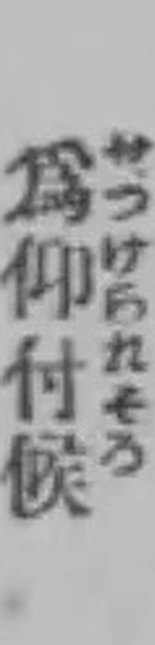為仰付候
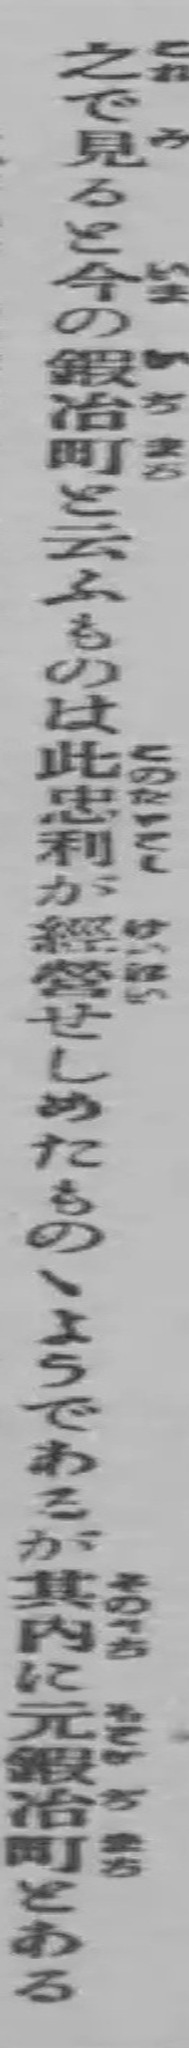元鍛冶町之で見ると今の鍛冶町と云ふものは此忠利が経営せしめたものゝようであるが其内に元鍛冶町とある
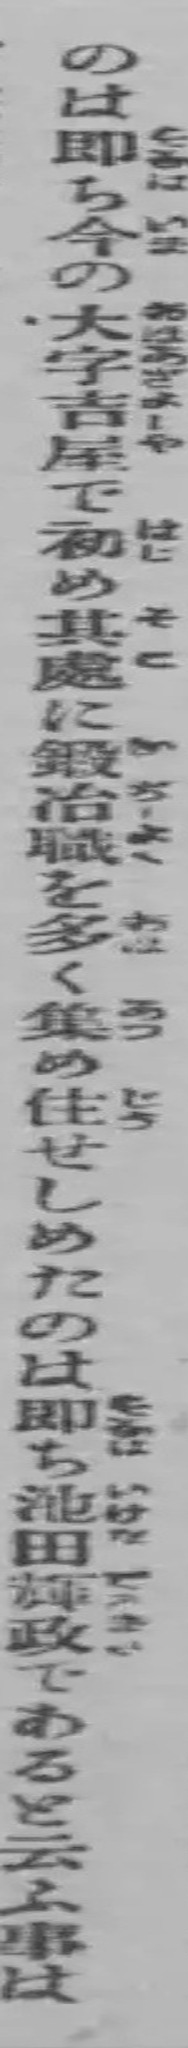のは即ち今の大字吉屋で初め其処に鍛冶職を多く集め住せしめたのは即ち池田輝政であると云ふ事は
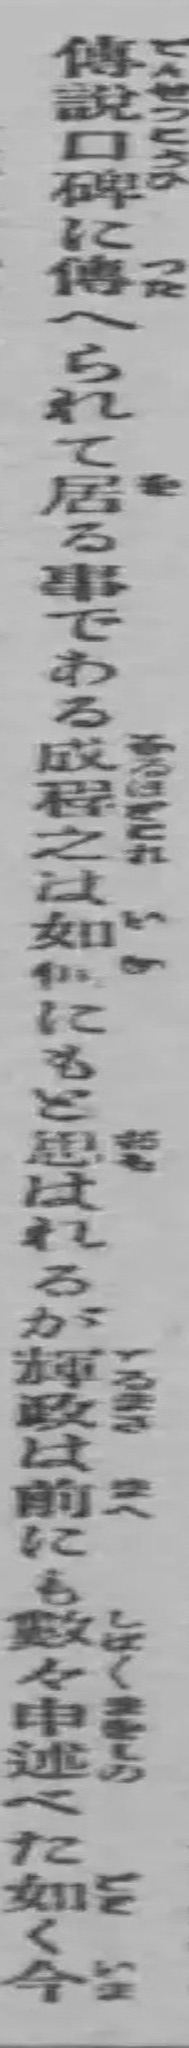伝説口碑に伝へられて居る事である成程之は如何にもと思はれるが輝政は前にも数々申述べた如く今
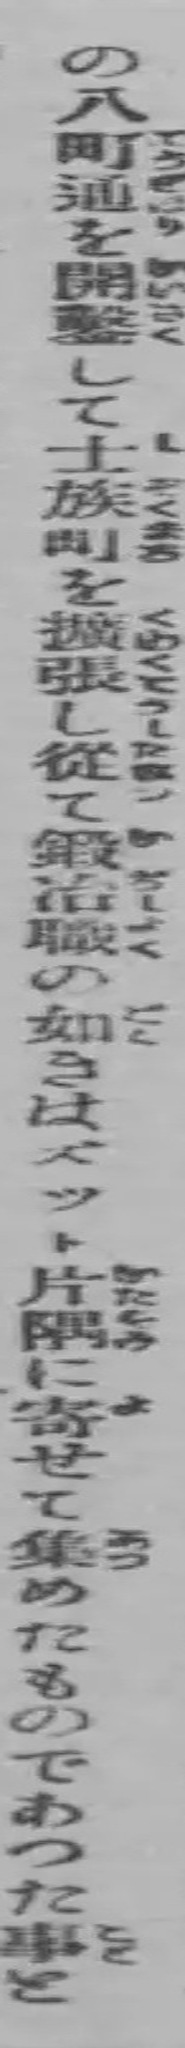の八町通を開鑿して士族町を拡張し従て鍛冶職の如きはズツト片隅に寄せて集めたものであつた事と
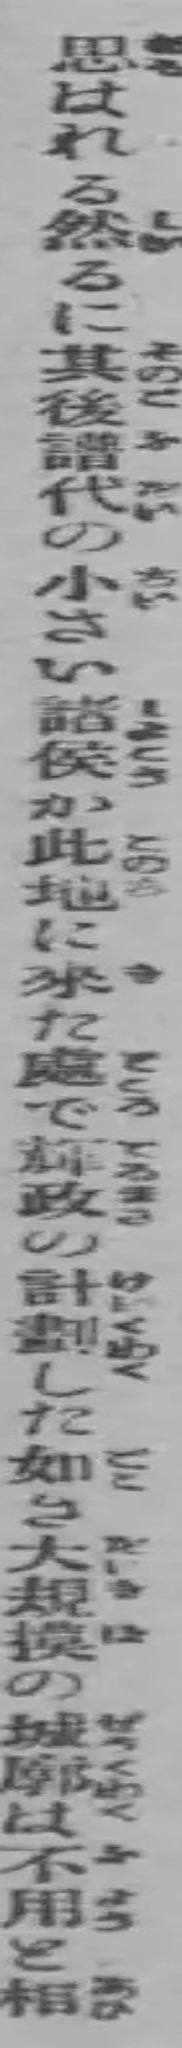思はれる然るに其後譜代の小さい諸侯が此地に来た処で輝政の計劃した如き大規模の城廓は不用と相

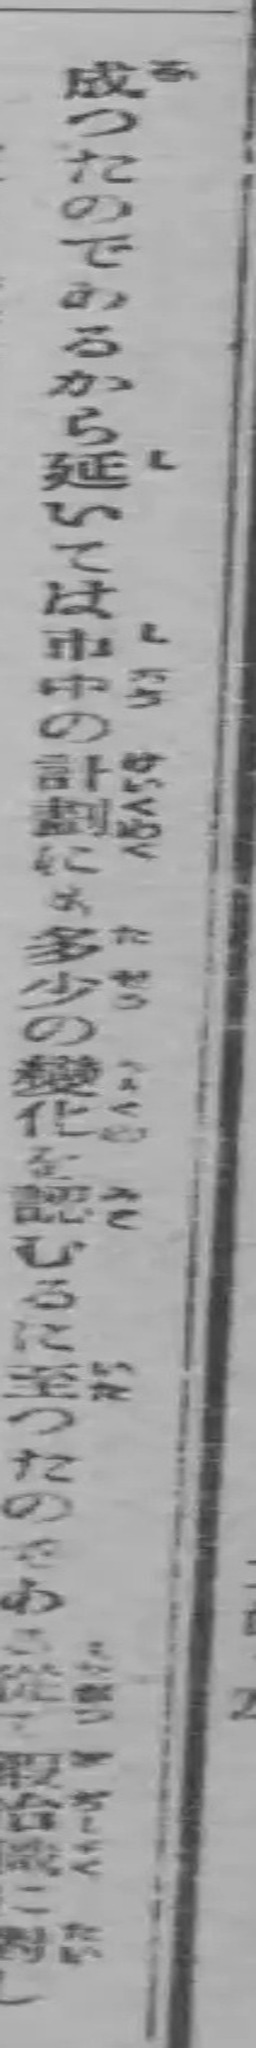成つたのであるから延いては市中の計劃にも多少の変化を認むるに至つたのである従て鍛冶職に対し
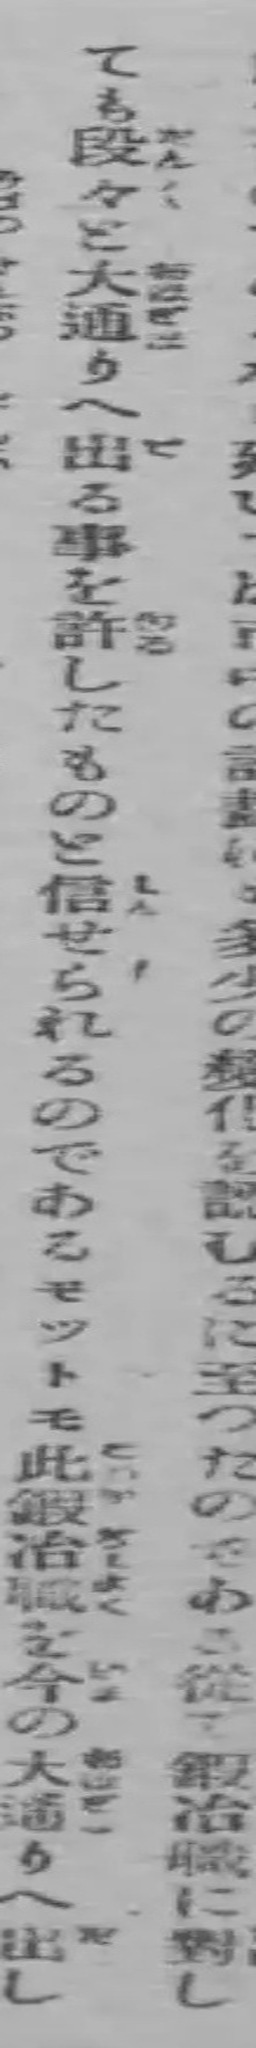ても段々と大通りへ出る事を許したものと信せられるのであるモツトモ此鍛冶職を今の大通りへ出し
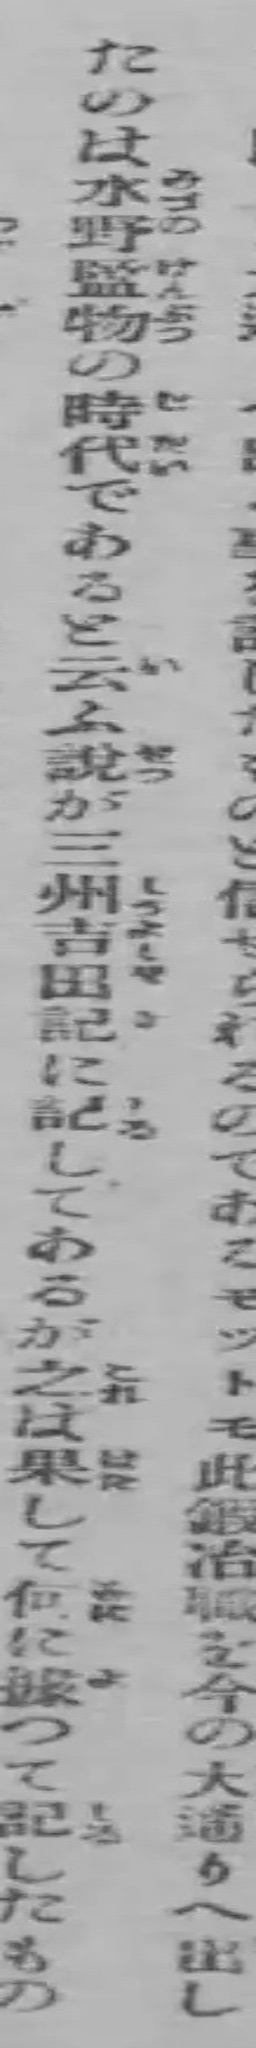たのは水野監物の時代であると云ふ説が三州吉田記に記してあるが之は果して何に拠つて記したもの
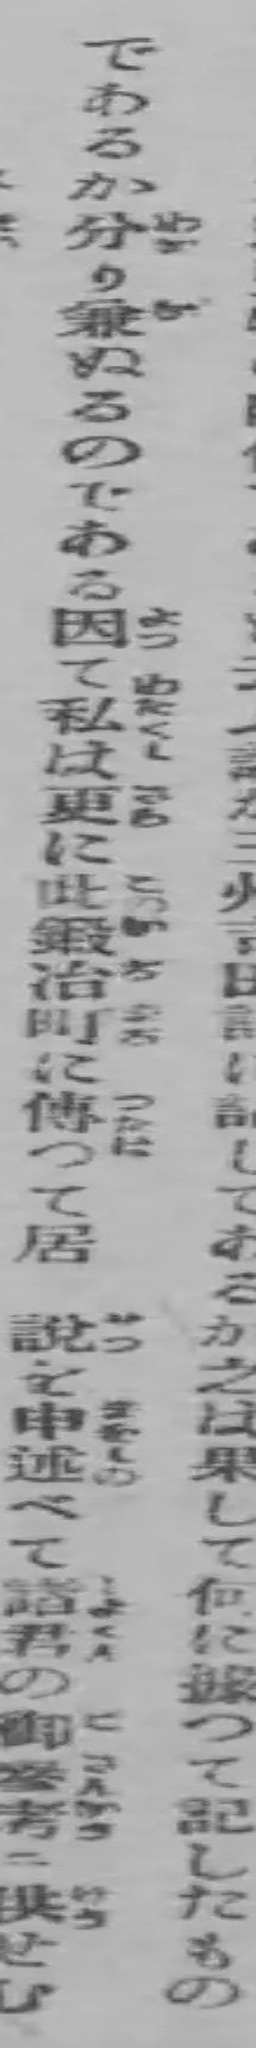であるか分り兼ぬるのである因て私は更に此鍛冶町に伝つて居る説を申述べて諸君の御参考ニ供せむ
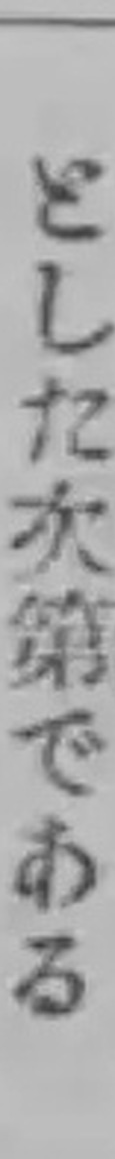とした次第である
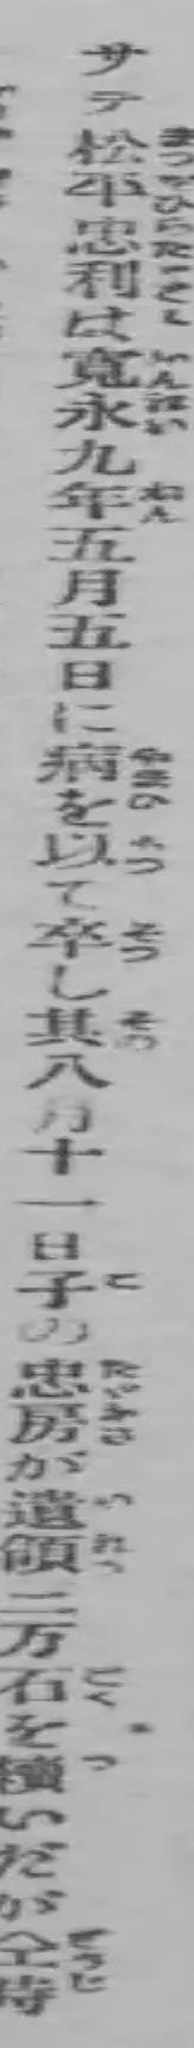サテ松平忠利は寛永九年五月五日に病を以て卒し其八月十一日子の忠房が遺領二万石を続いだが仝時
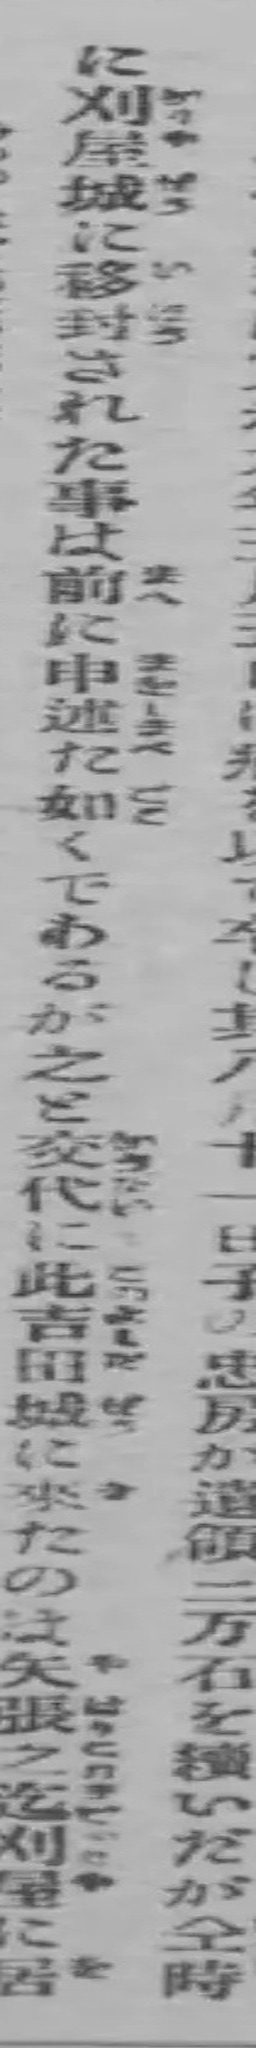に刈屋城に移封された事は前に申述た如くであるが之と交代に此吉田城に来たのは矢張之迄刈屋に居
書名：豊橋市史談
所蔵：国立国会図書館 National Diet Library, JAPAN
